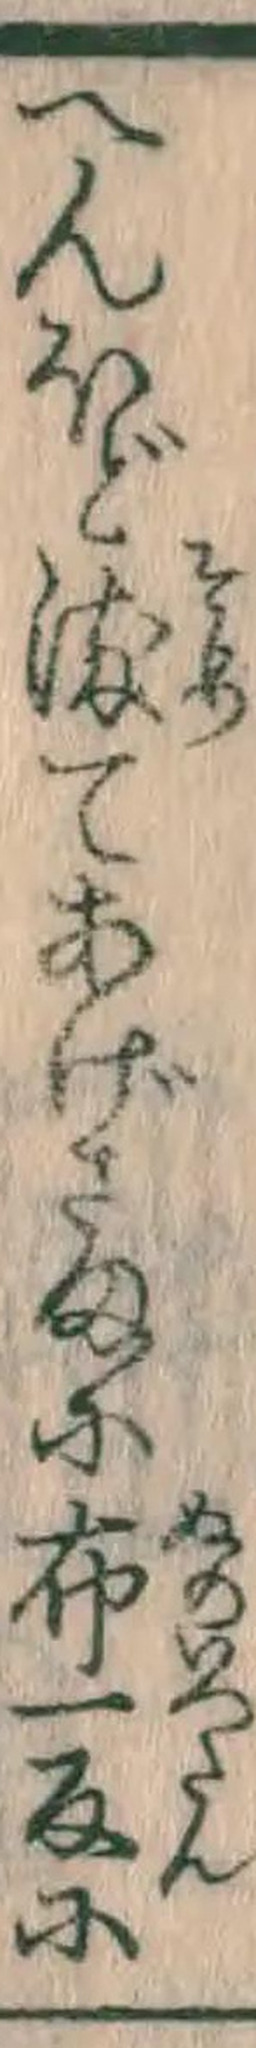へんほど染てあげさまに布一反に
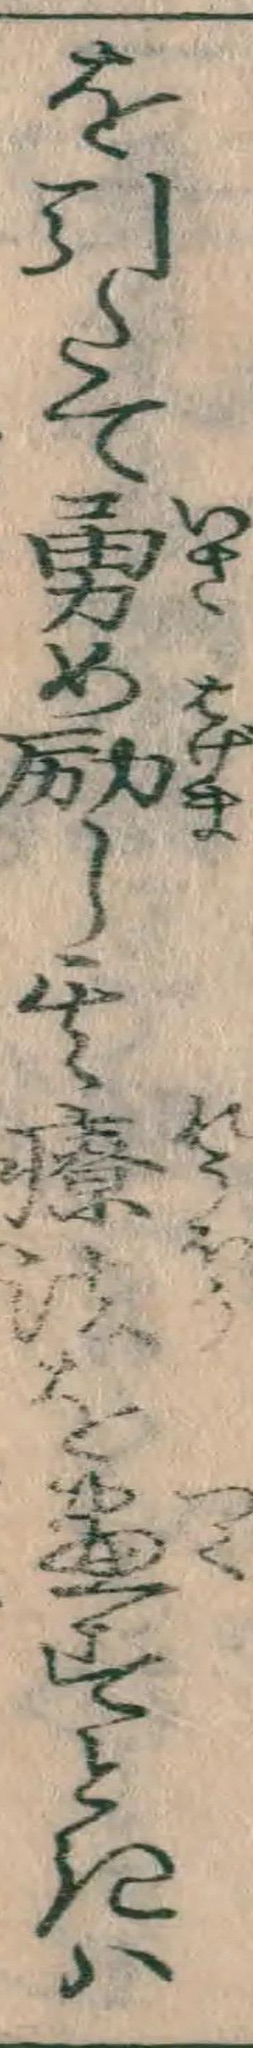を引たて勇め励し其療法を盡すときは
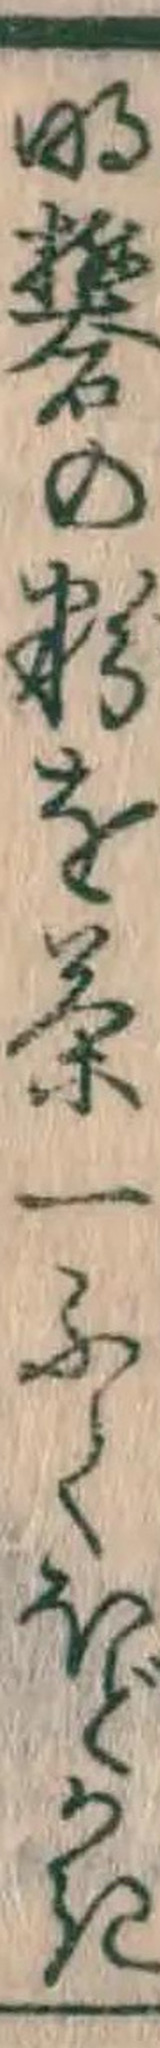明礬の粉を茶一ふくほどかき
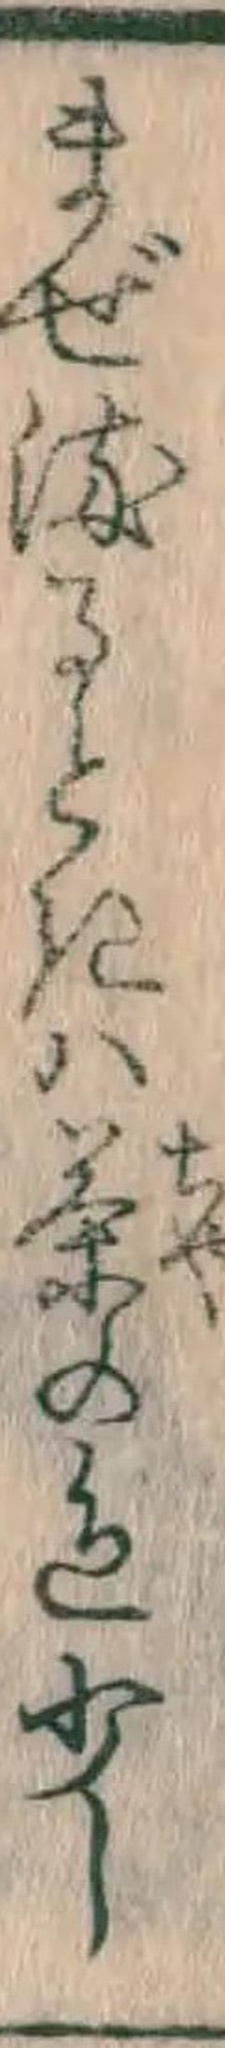まぜ染るときは茶の色少し
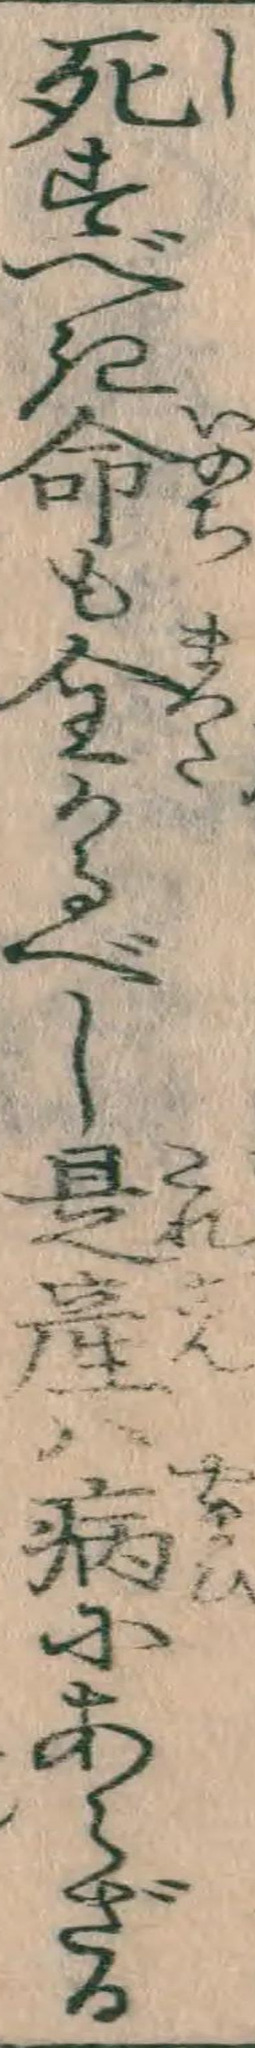死すべき命も全かるべし是産は病にあらざる
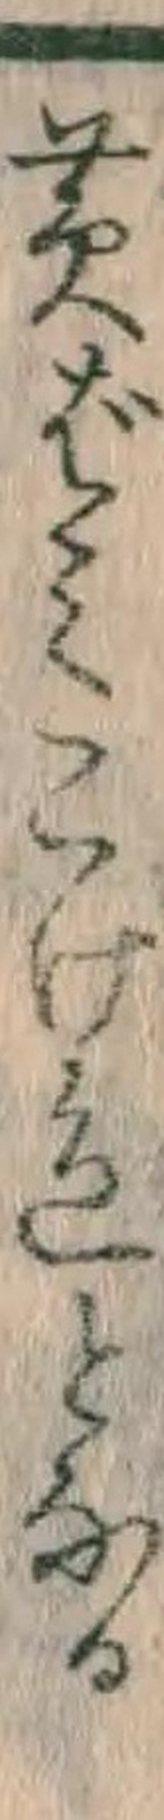黄ばみこげ色となる
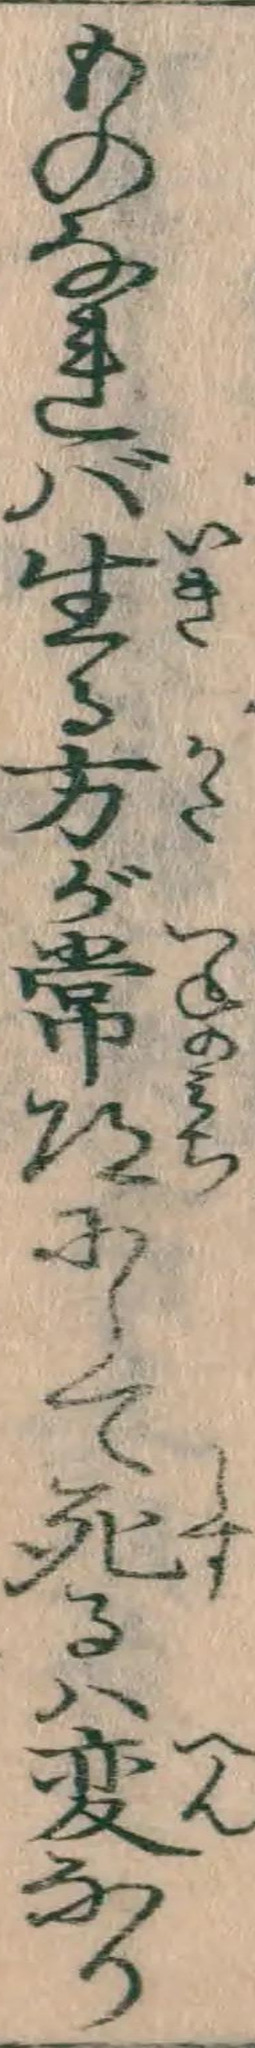ものなれば生る方が常道にして死るは変なり
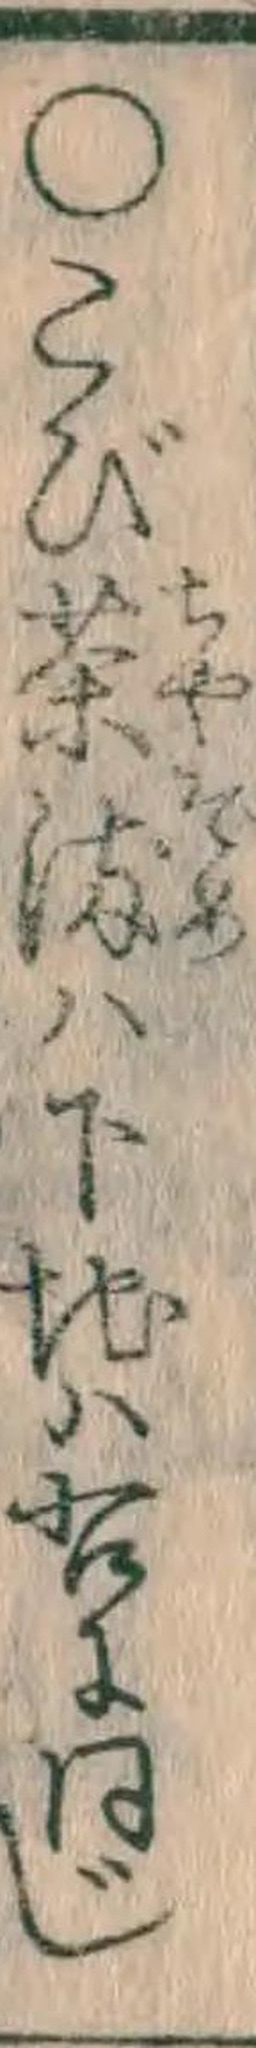○こび茶染は下地は右に同じ
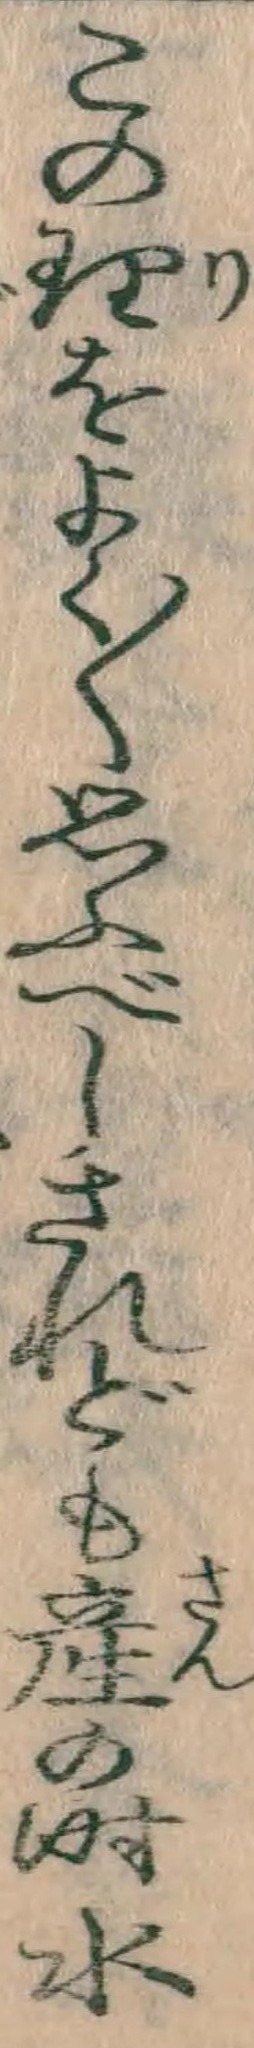この理をよく〳〵思ふべしされども産の時水
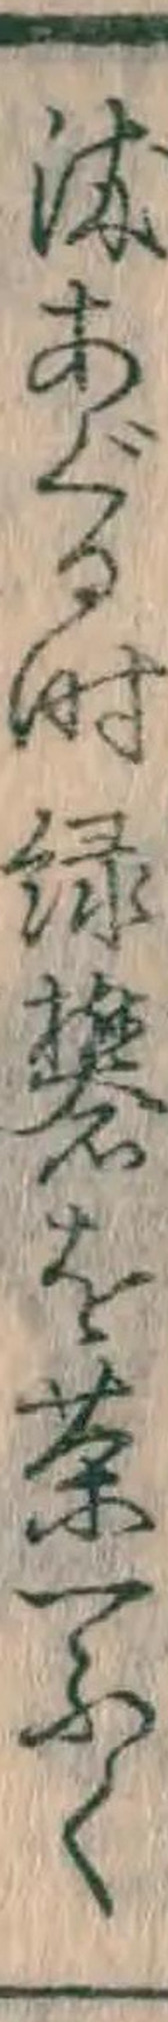染あぐる時緑礬を茶一ふく
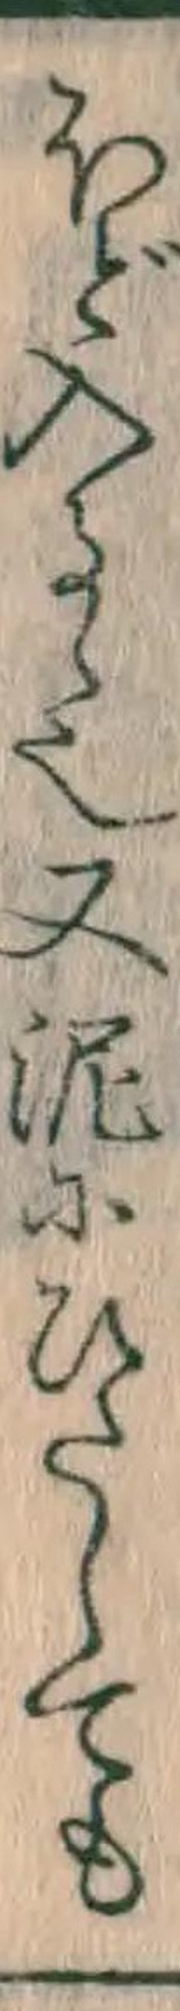ほど入るゝ也又泥にひたしても
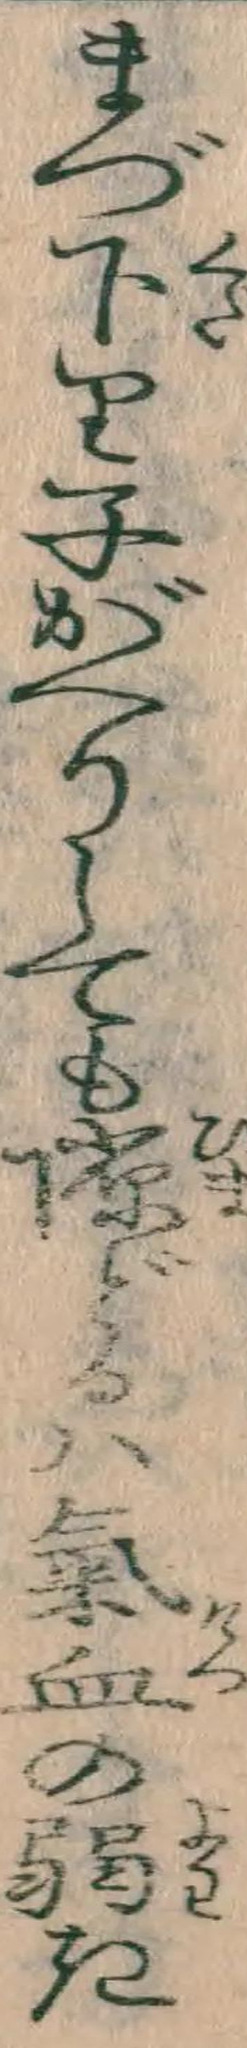まづ下り子がへりしても隙どるは気血の弱き
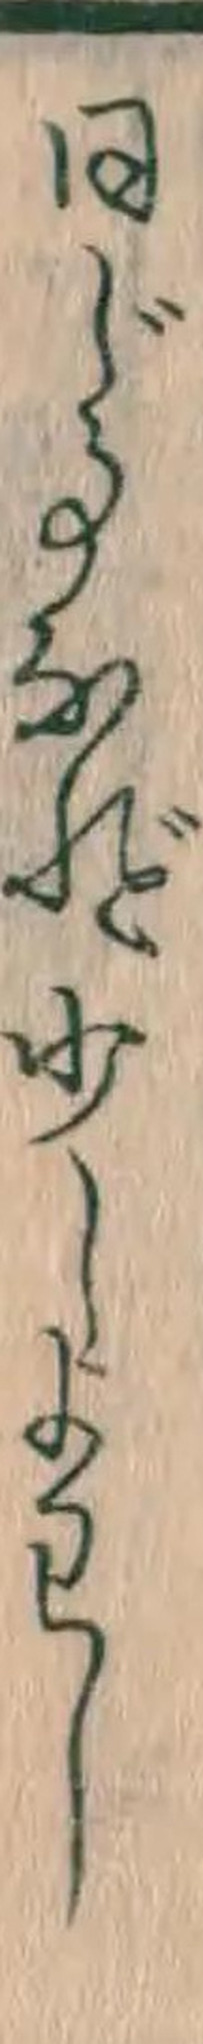同じ事なれど少しよわし
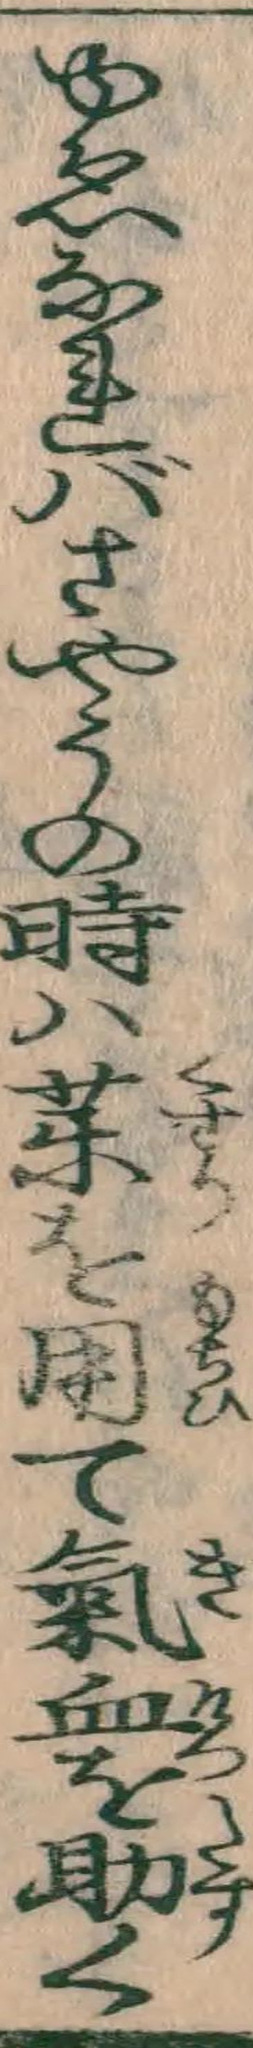ゆゑなればさやうの時は薬を用て気血を助く
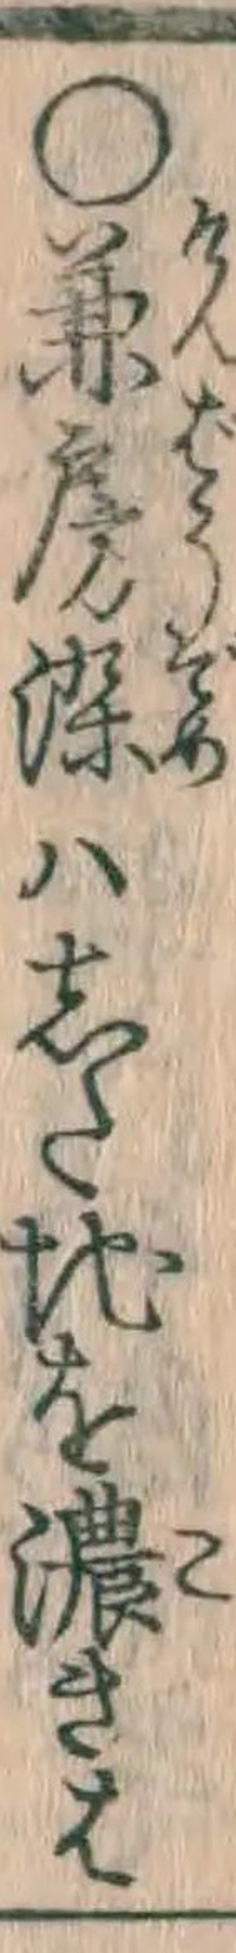○兼房染はした地を濃きは
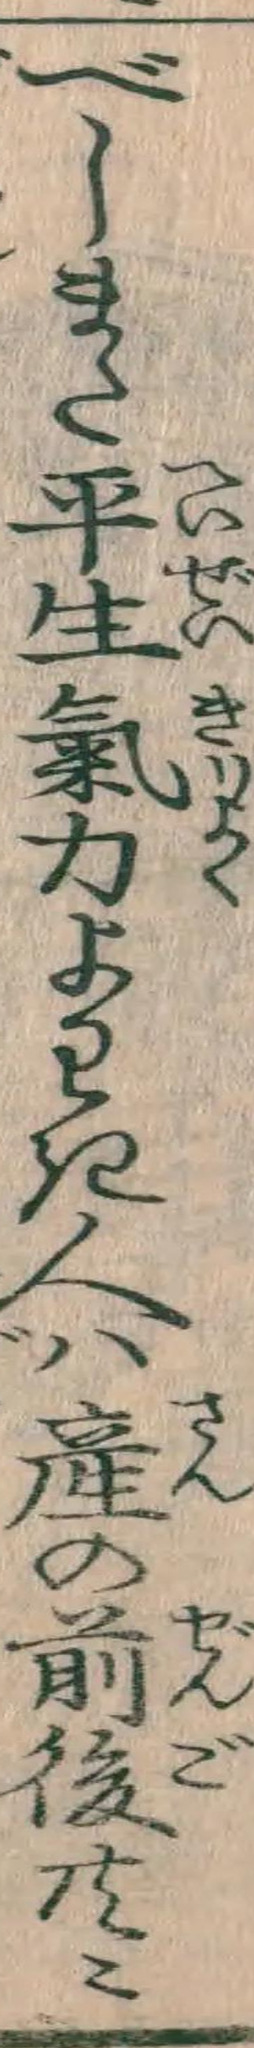べしまた平生気力よわき人は産の前後共々
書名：広益秘事大全 3巻. [3]
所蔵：国立国会図書館 National Diet Library, JAPAN
